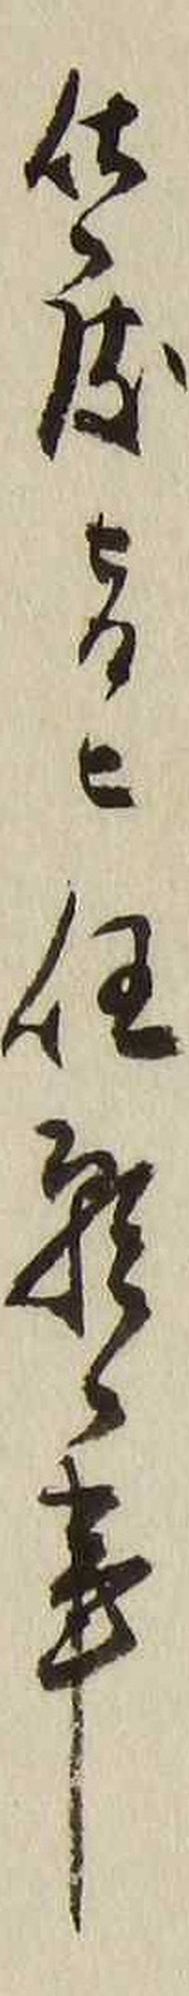仕度旨被任願候事
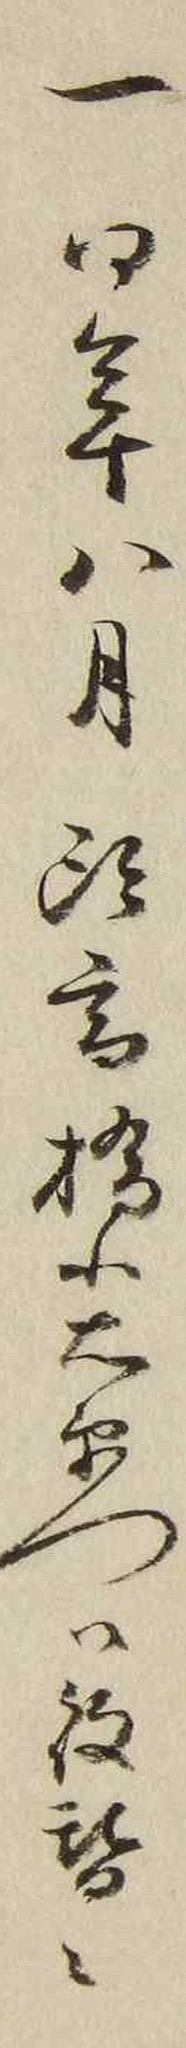一同年八月頭高橋小右衛門御役替ニ

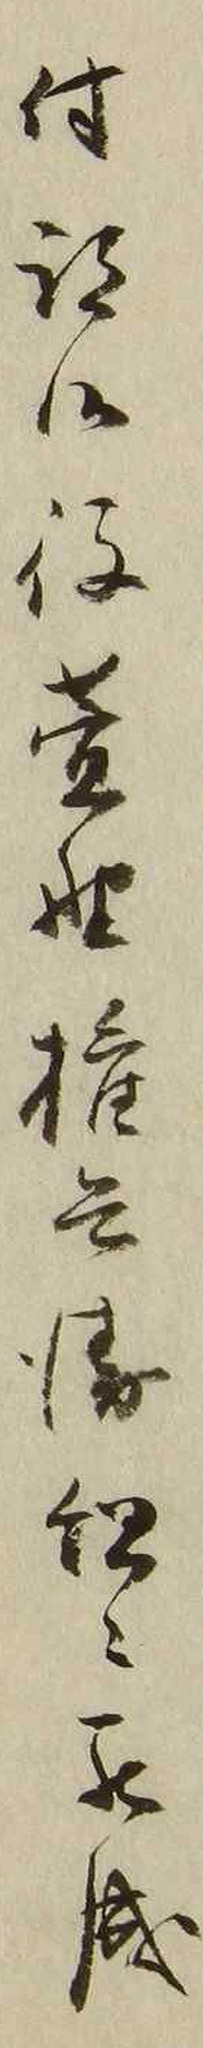付跡御役萱野権兵衛組ニ罷成
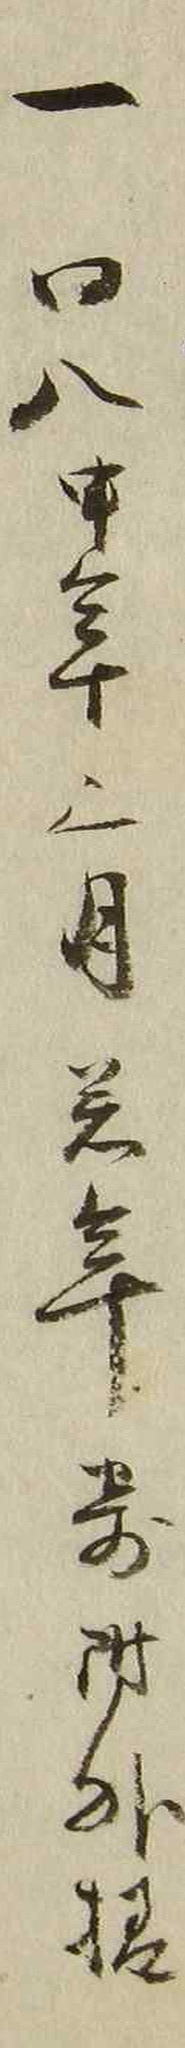一同八申年三月若年寄附外様
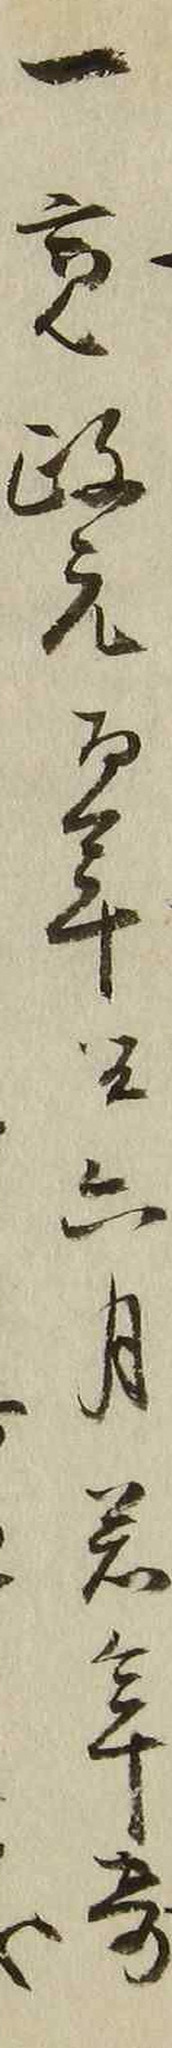一寛政元酉年閏六月若年寄
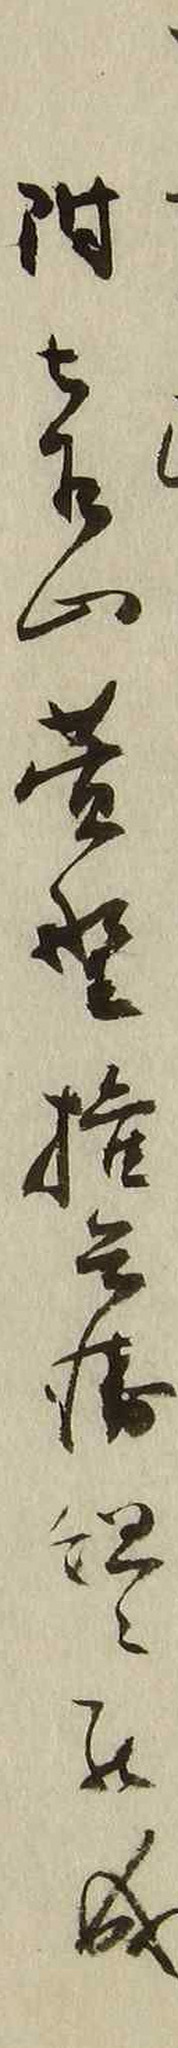附被相止萱野権兵衛組ニ罷成
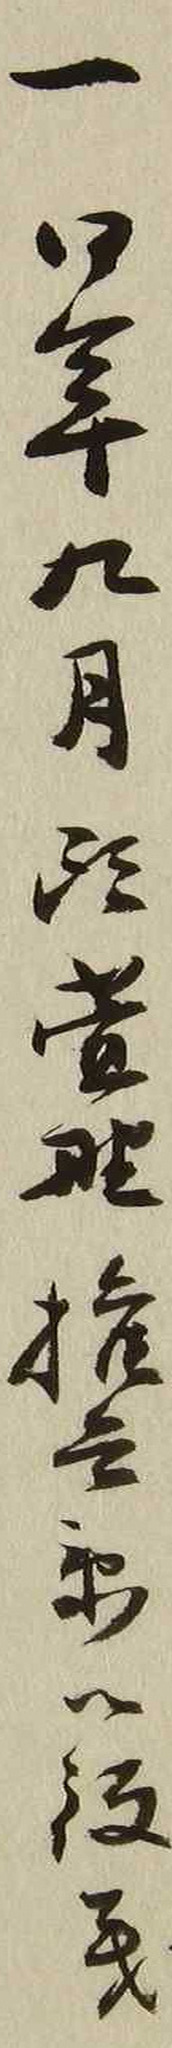一同年九月頭萱野権兵衛御役義
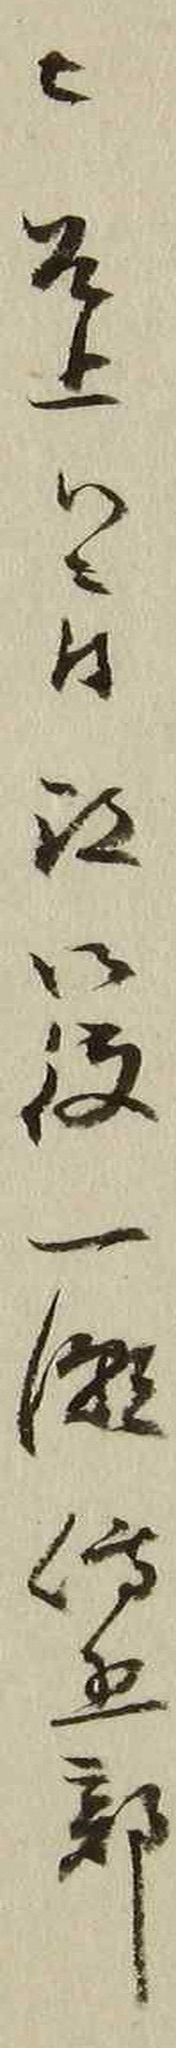被召上候ニ付跡御役一瀬伝五郎
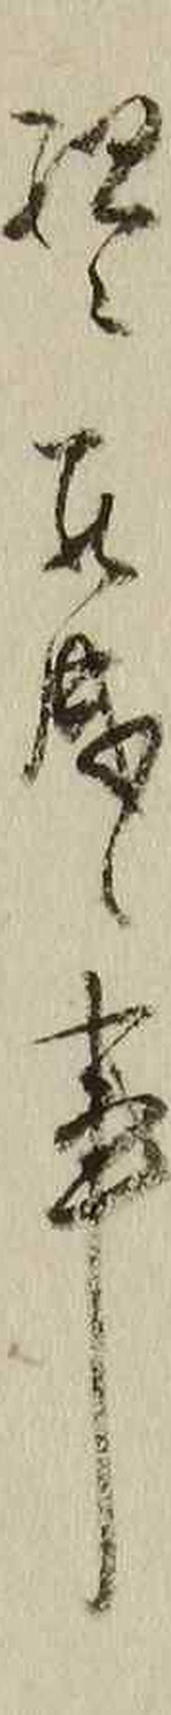組ニ罷成候事
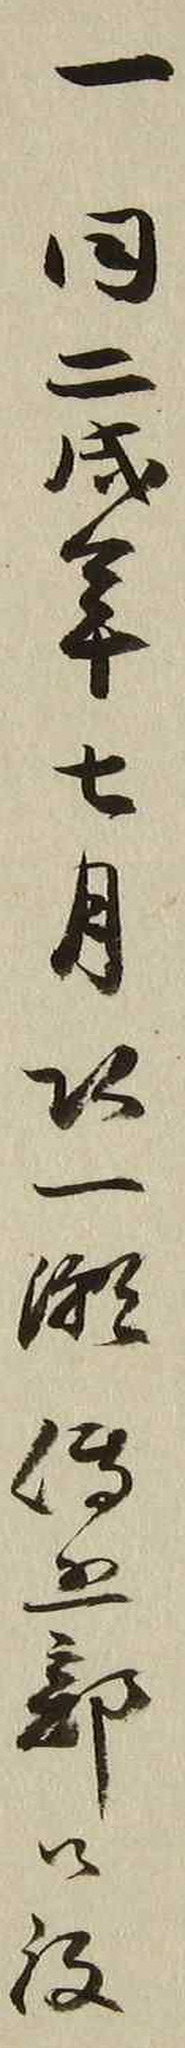一同二戌年七月頭一瀬伝五郎御役
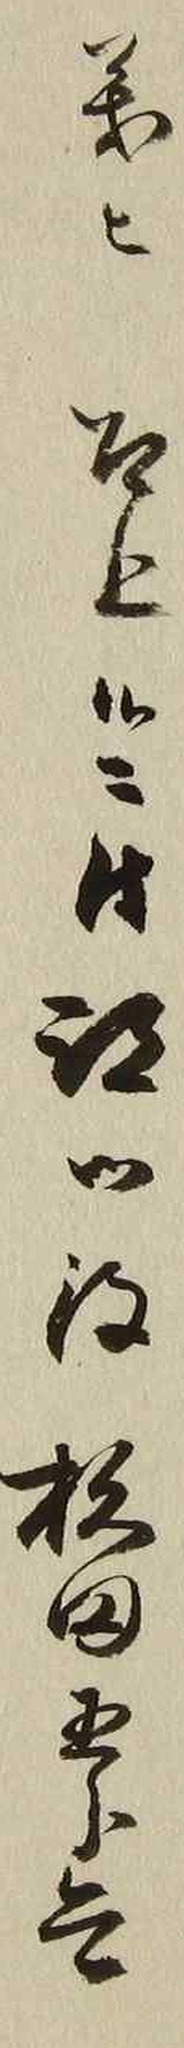義被召上候ニ付跡御役杉田五郎兵
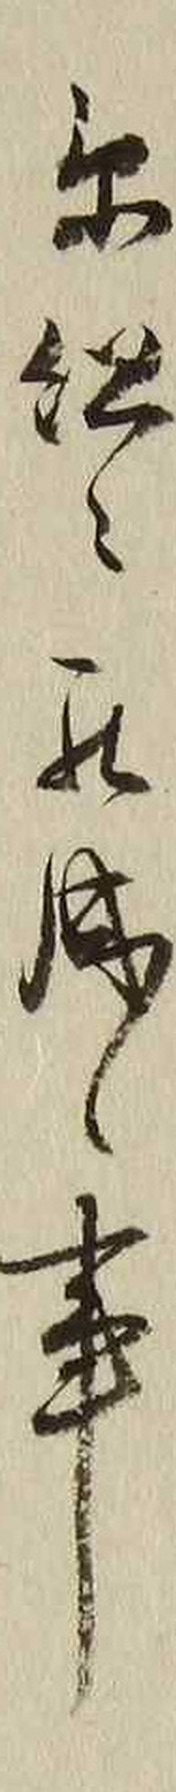組ニ罷成候事
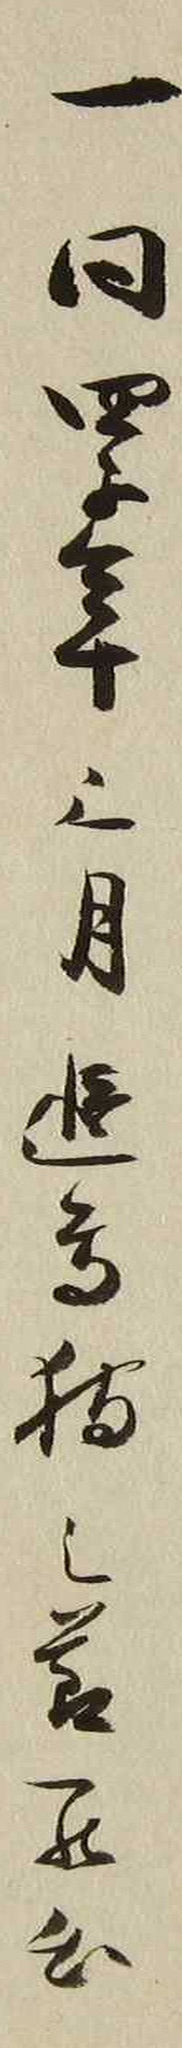一同四子年三月追鳥狩之節罷出
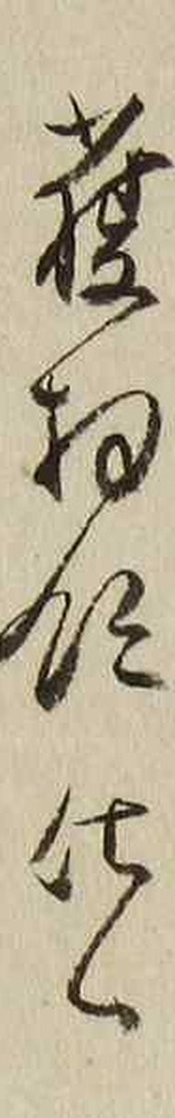獲拝領仕候
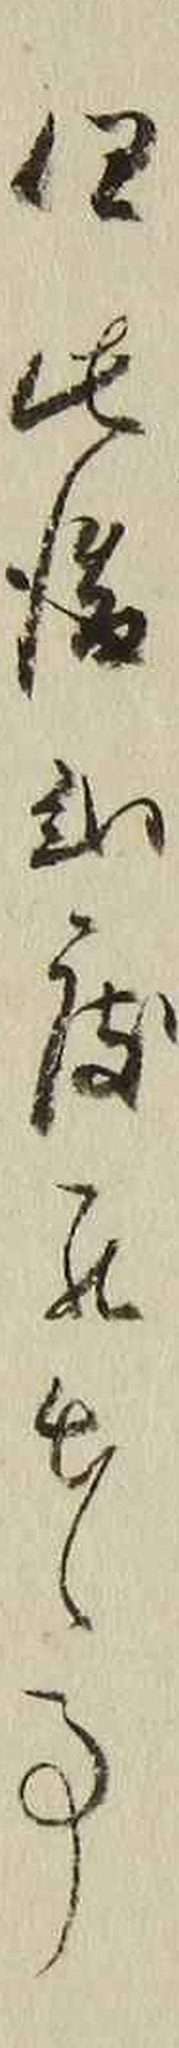但此後弐度罷出候事
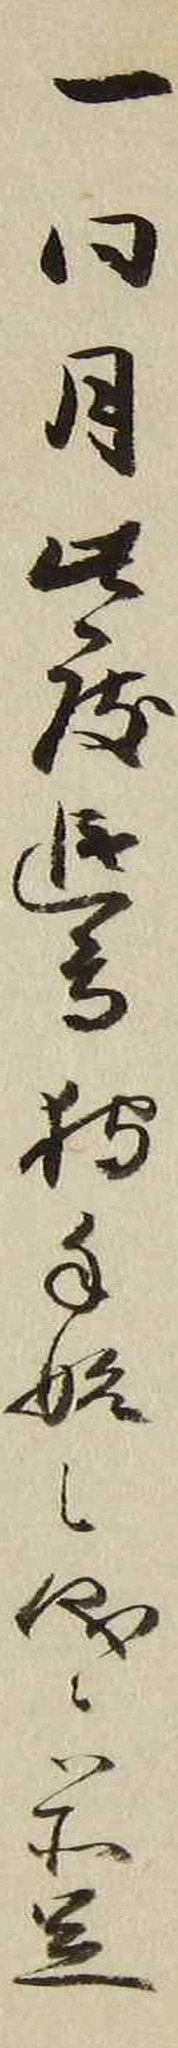一同月此度追鳥狩手始之儀ニ候所足
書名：諸士系譜　巻之288　さ之部20
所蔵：会津若松市立会津図書館
